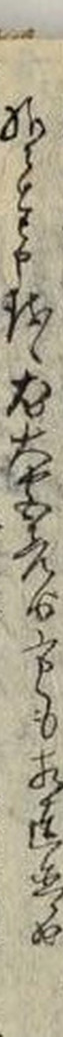様にと被申越候尤大宮彦右衛門方へも相達置候由
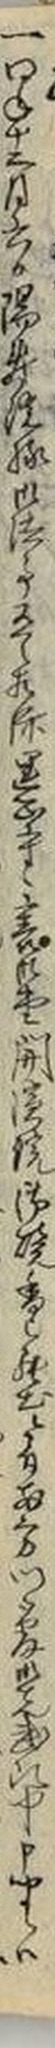一同年十二月六日陽寿院様御法事有之相済運正寺へ裏御堂開演院御焼香被罷出候に付前方門御番御先武頭中申聞候は
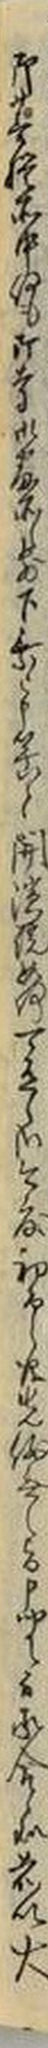御菩提所中何も御寺御番所之前下乗被申筈と開演院如何可有之哉今度初て之儀先例無之旨申聞候に付承合候処前以大
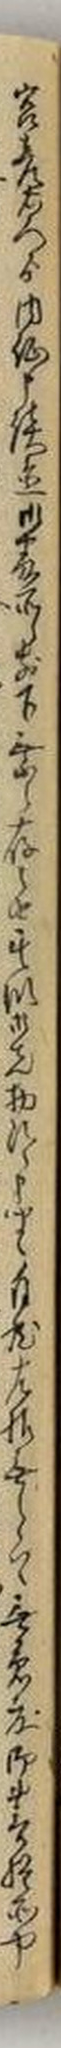宮彦右衛門ゟ内証申談置御番所之前下乗と存候由其段御先物頭へ申聞候自然左様無之候はゝ無急度御菩提所中
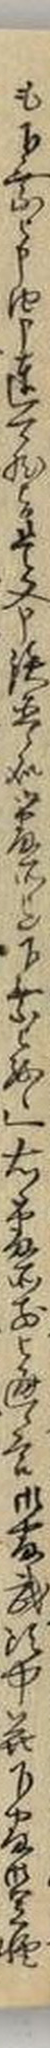も下乗被申由申達可然旨候是又申談置候処御番所迄下乗被致候」右御番所前被通候節御番武頭中并下番御足軽
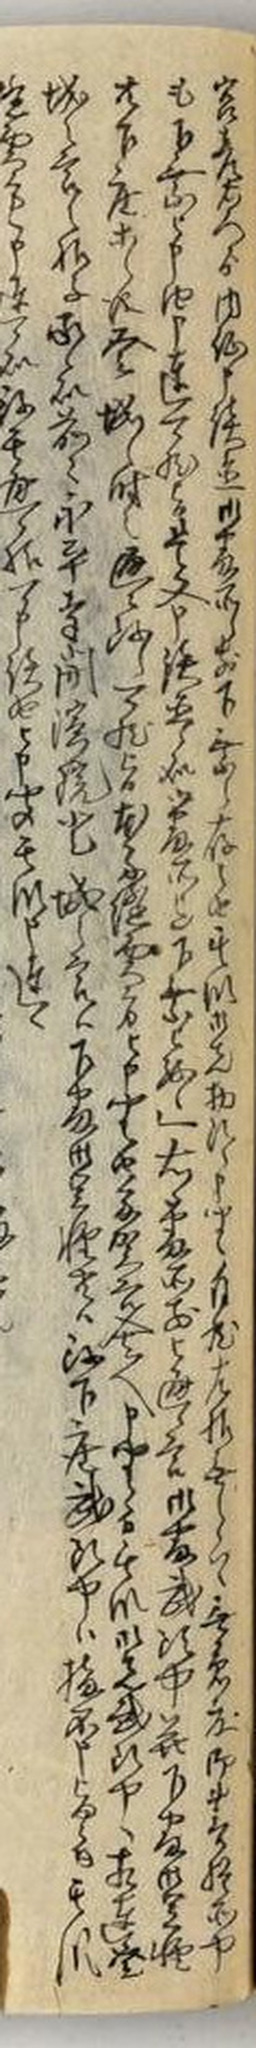共下座等之儀登城之時之通に致し可然旨本多縫殿方被申聞候由多賀谷舎人申聞候付其段御先武頭中へ相達登
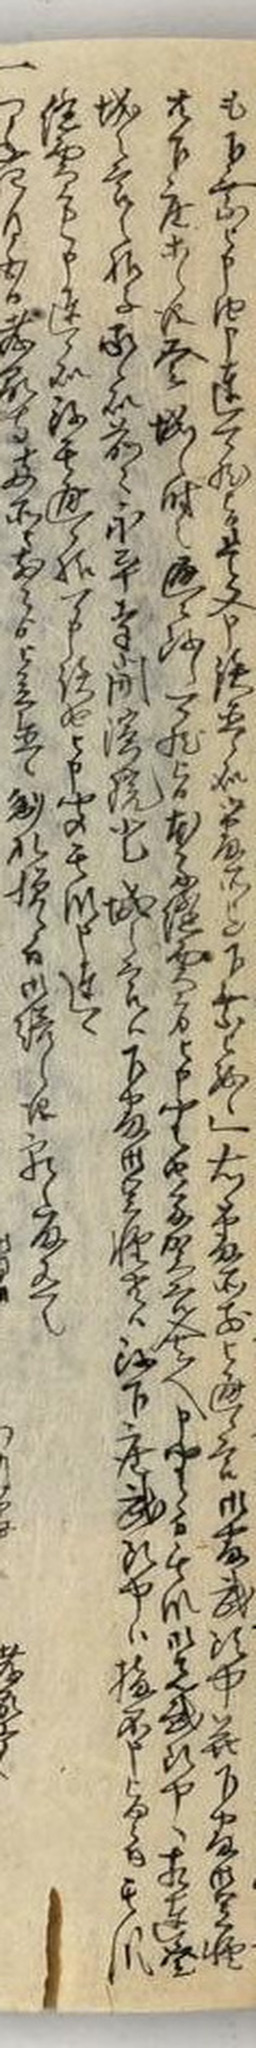城之節之様子承候処前々永平寺開演院登城之節は下番御足軽共は致下座武頭中は構不申旨に付其段
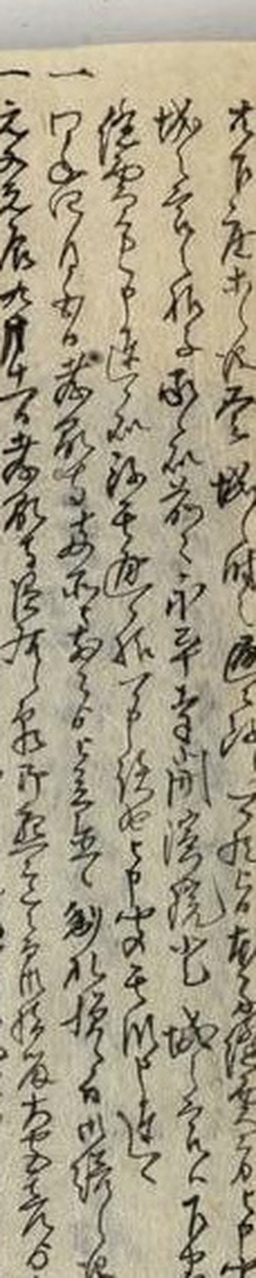縫殿方へ申達候処致其通候様可申談由被申聞其段申達候
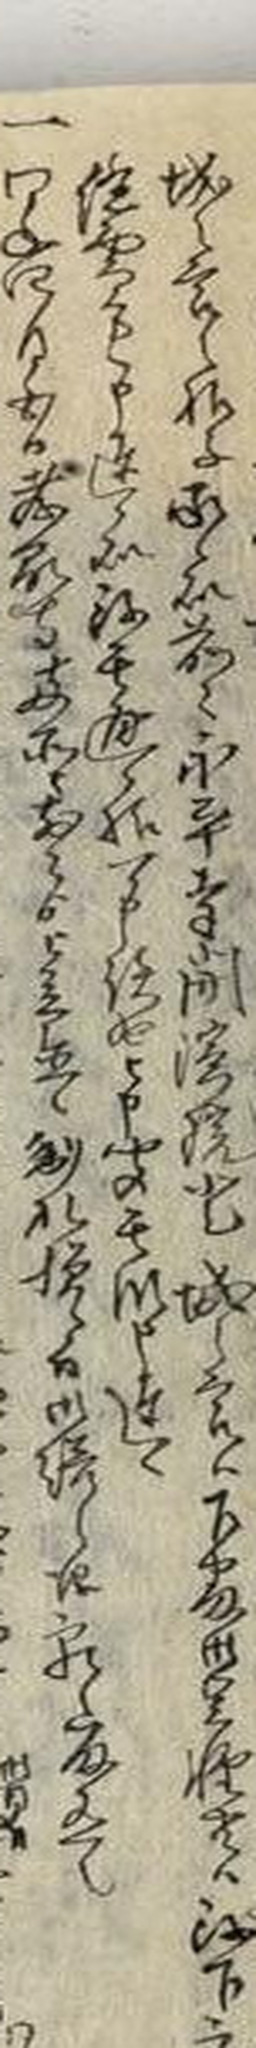一同年四月五日孝顕寺両所に前々ゟ被立置候制札損候に付御繕之儀願之留有之
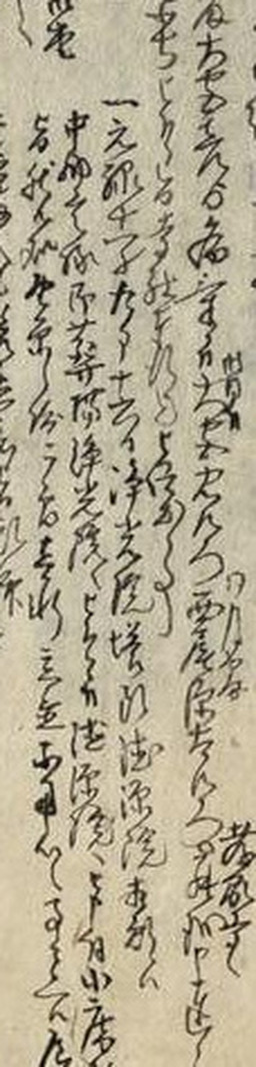一元禄十一刁九月十六日浄光院塔頭徳源院相願候は
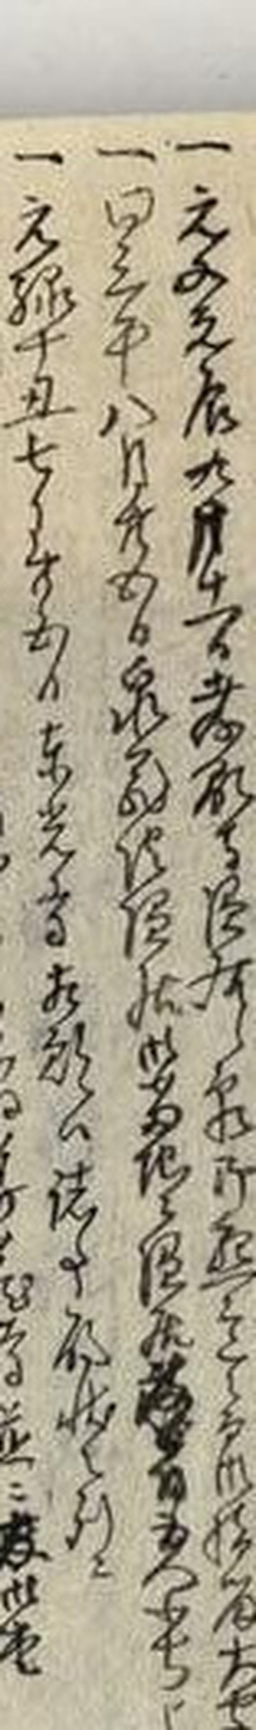一元禄十丑七月廿五日東光寺相願候は諸事触状之列に
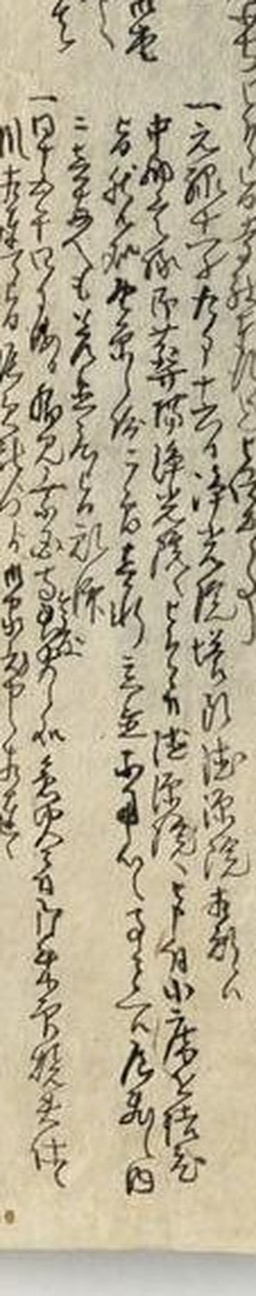旨然ル処野原之儀に候間壱軒立置不用心之事に候へは屋敷之内
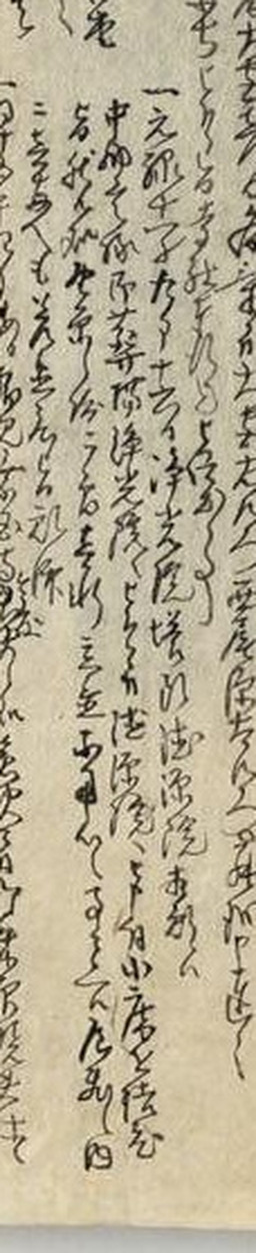中納言様御葬場浄光院へ被下候付徳源院へ被申付小庵を結度
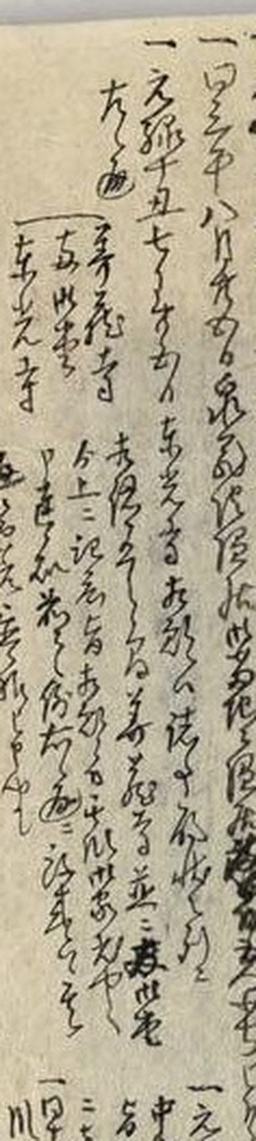左の通華蔵寺相認有之候間華蔵寺並に両御堂
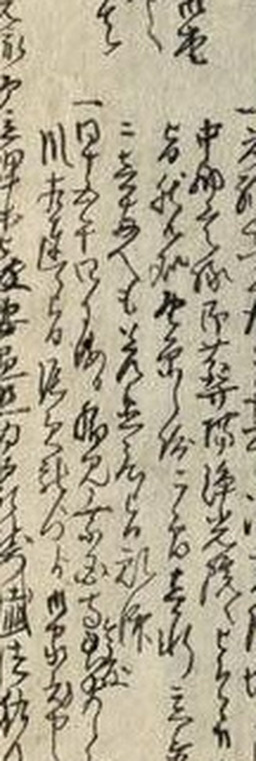に壱両人も差置度旨願済
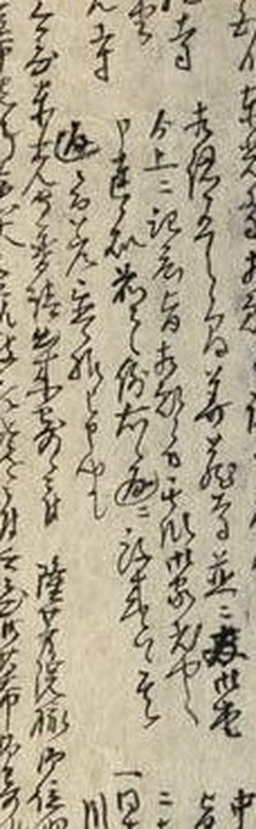東光寺申達候処前々之儀右之通に致来候はゝ其
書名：御城下諸事之部
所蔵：福井県文書館 Fukui Prefectural Archives
